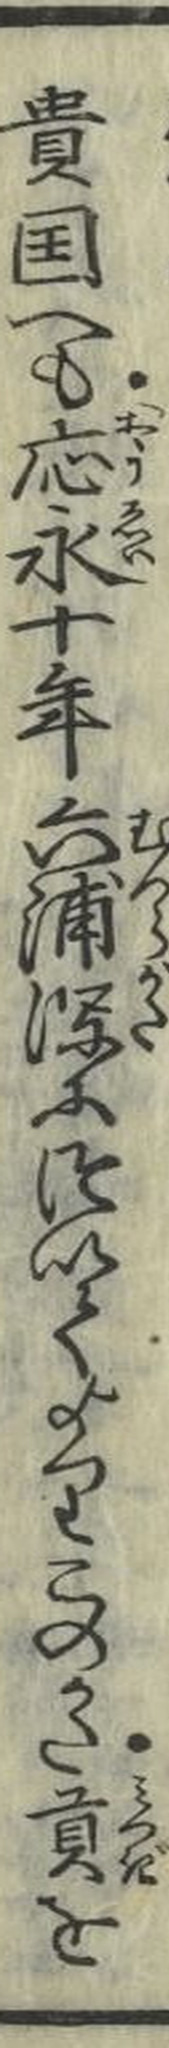貴国へも・応永十年六浦泻についてよりこのかた・貢を
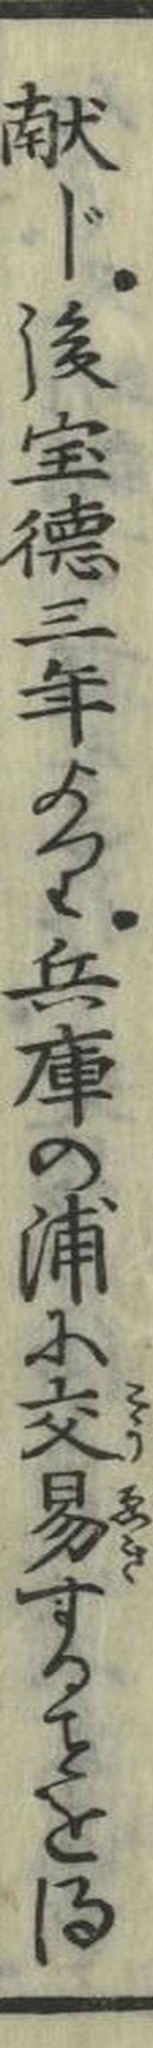献じ・後宝德三年より・兵庫の浦に交易することを得

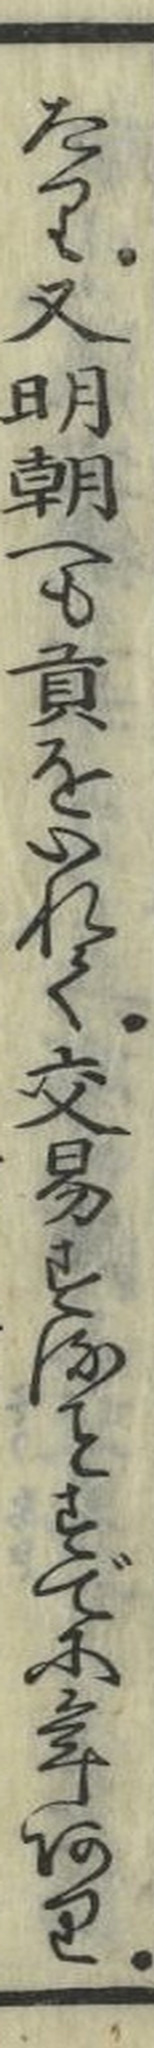たり・又明朝へも貢をいれて・交易することすでに年あり・
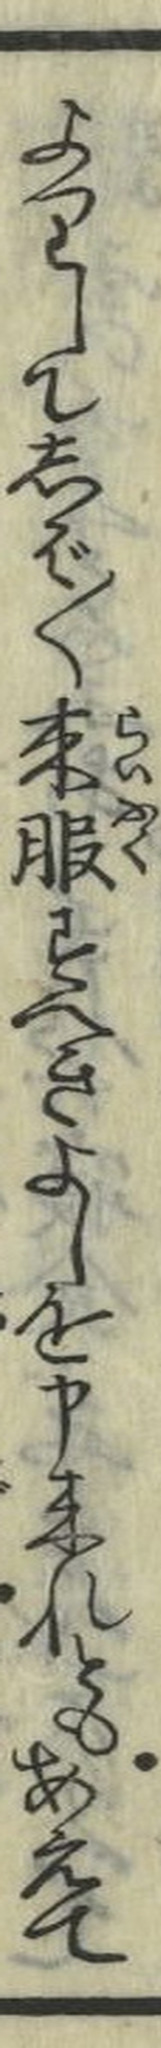よりしてしば〳〵来服すへきよしを申来れとも・あえて
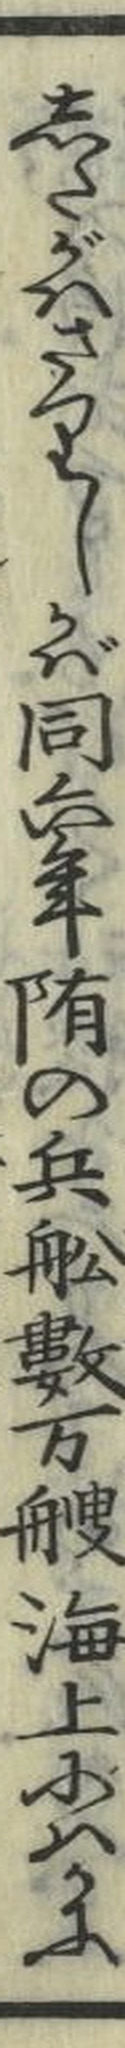したがはさりしかば・同六年陏の兵舩・數万艘・海上にはかに
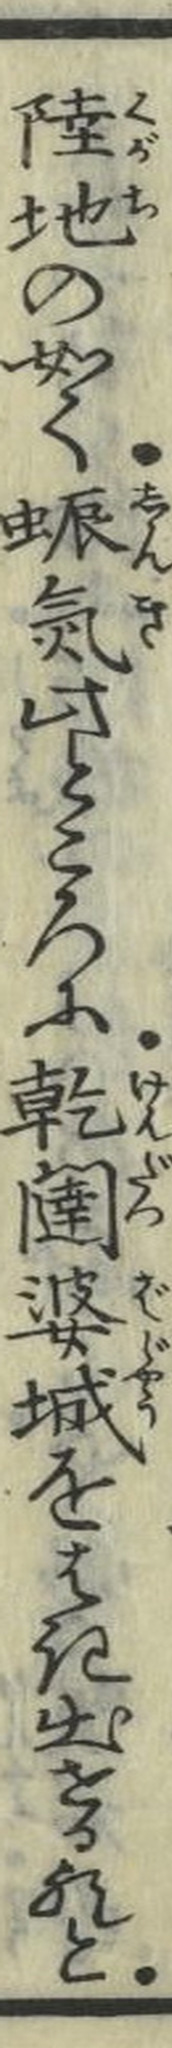陸地の如く・蜄𣱛此ところに・乾闥婆城をはき出せるれと・
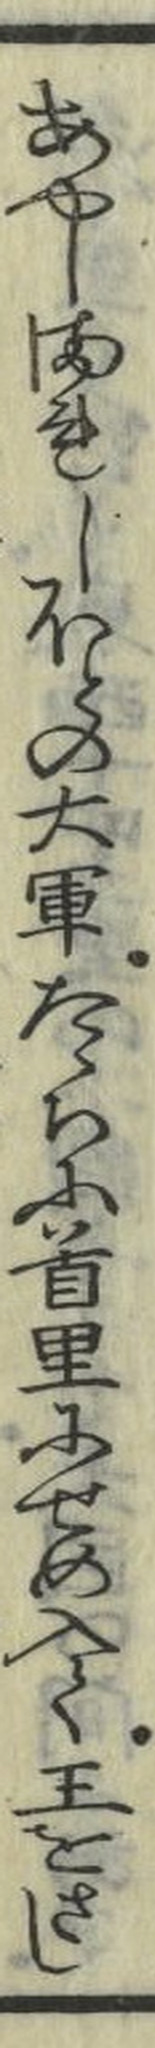あやしまれしほとの大軍・たゝちに首里にせめ入て・王をさし
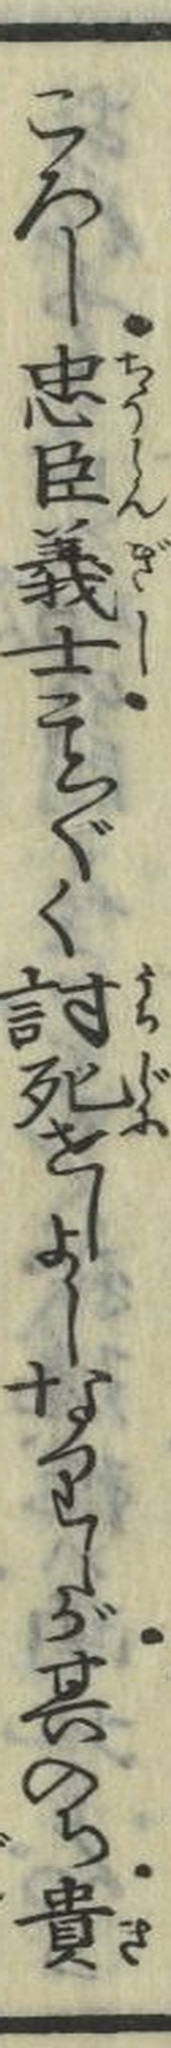ころし・忠臣義士・こと〴〵く討死せしよしなりしが・其のち・貴
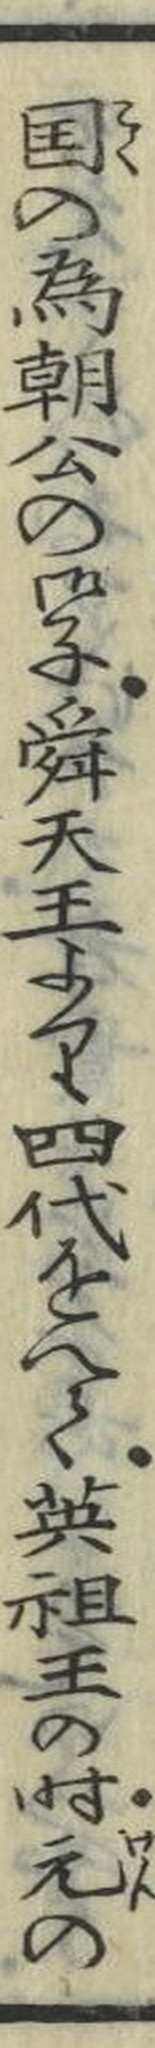国の爲朝公の御子・舜天王より四代をへて・英祖王の時・元の
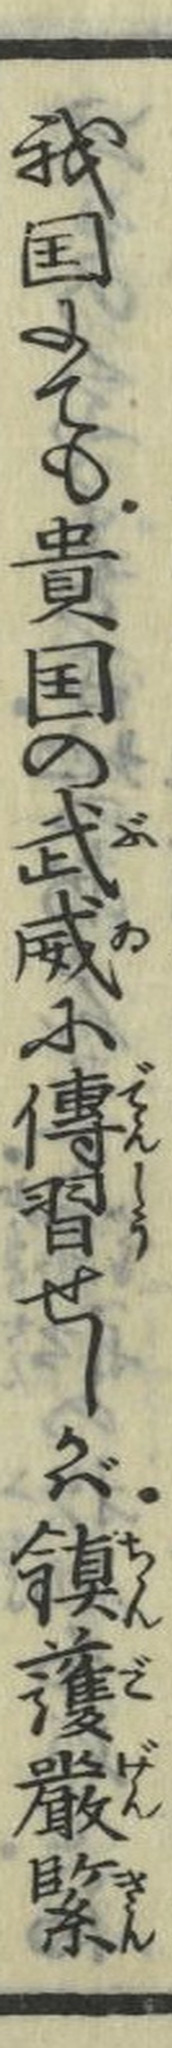我国にても・貴国の武威に傳習せしかば・鎮護嚴緊
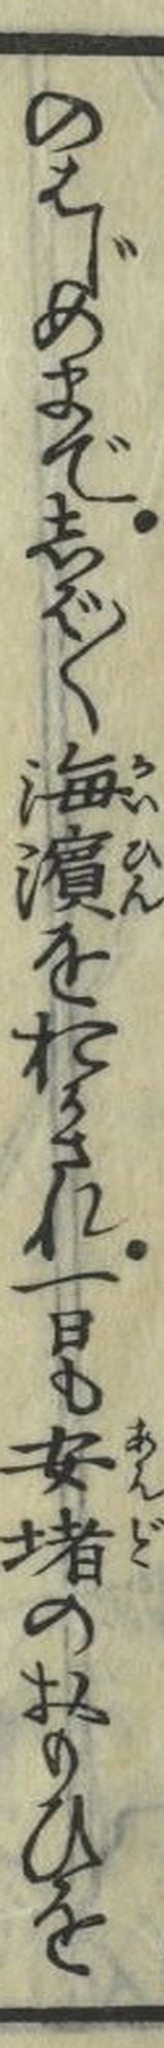のはじめまで・しば〳〵海濱をおかされ・一日も安堵のおもひを
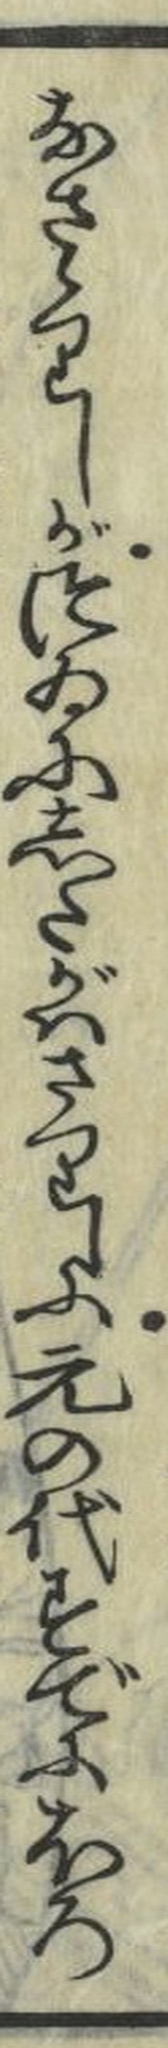なさゝりしが・つゐにしたがはさりしに・元の代すでにほろ
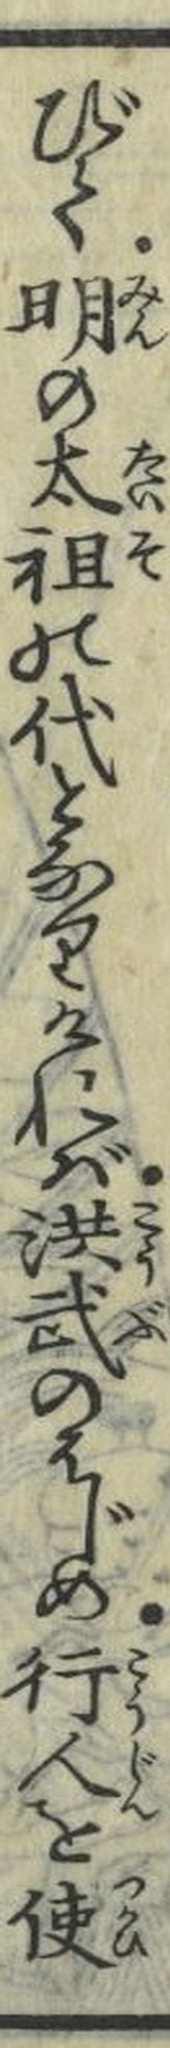びて・明の太祖の代となりければ・洪武のはじめ・行人を使
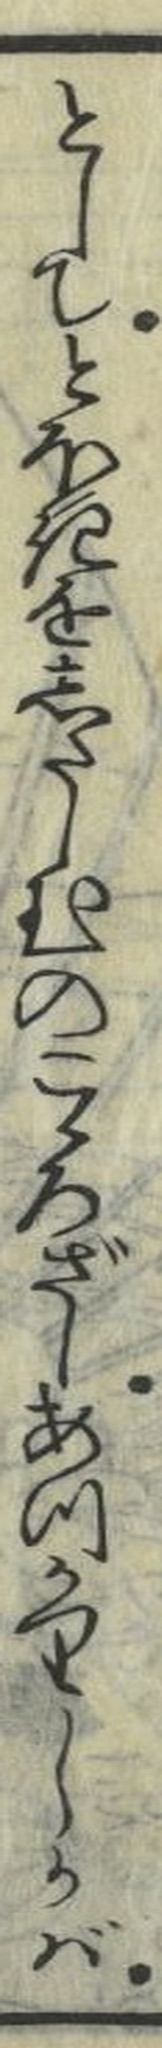として・とほきをしたしむのこゝろざし・あつかりしかば・
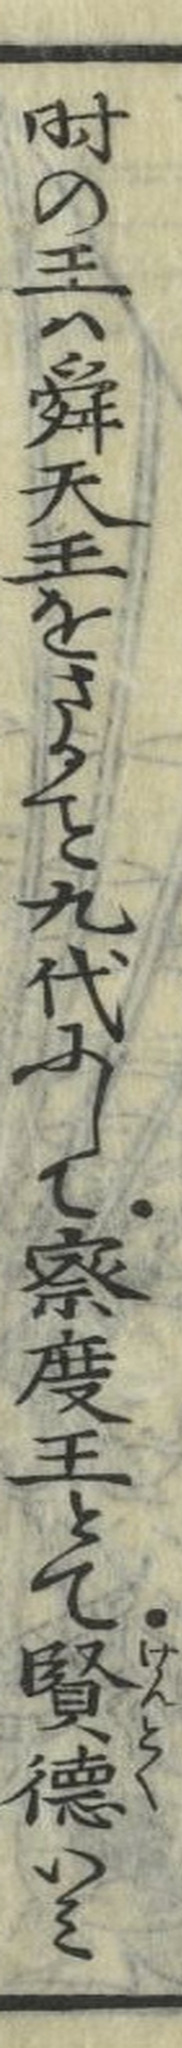時の王は舜天王をさること九代にして・察度王とて・賢德いみ
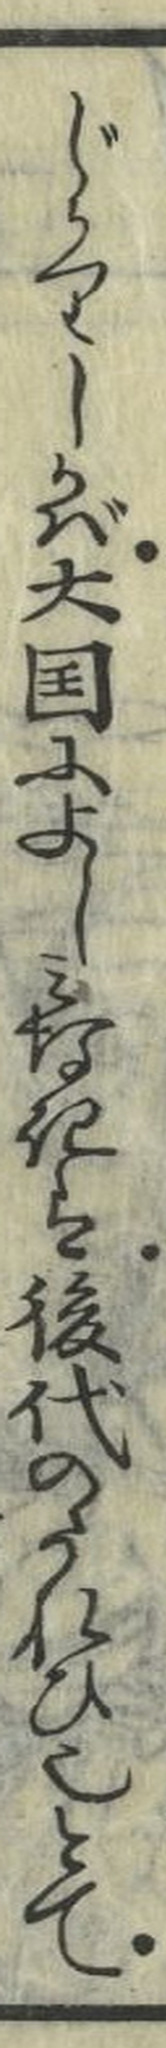じかりしかば・大国によしみなきは・後代のうれひ也とて・
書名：琉球秊代記 附雑話 全
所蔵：University of the Ryukyus Library
